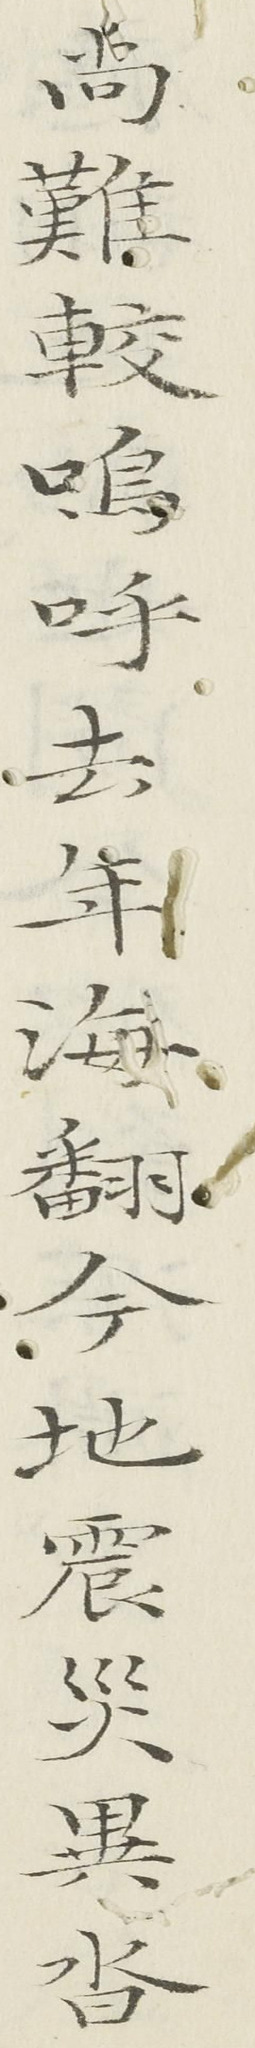尚難較嗚呼去年海翻今地震災異沓
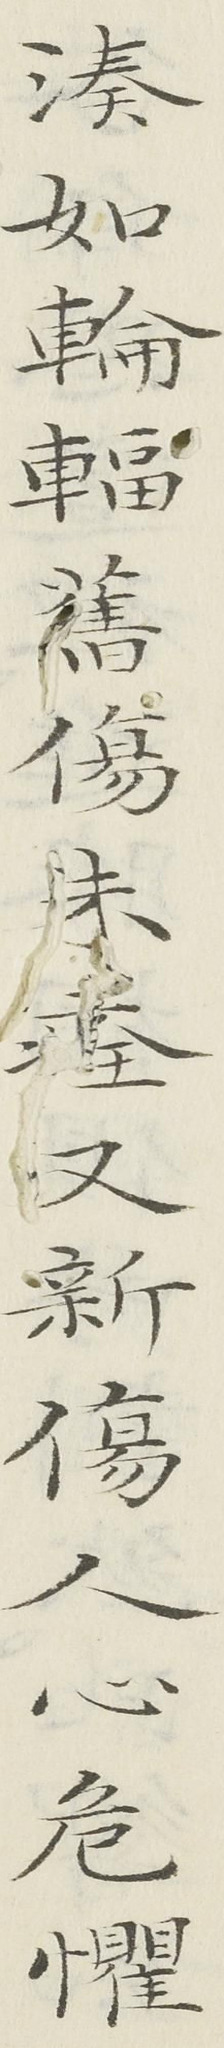湊如輪輻旧傷未痊又新傷人心危懼
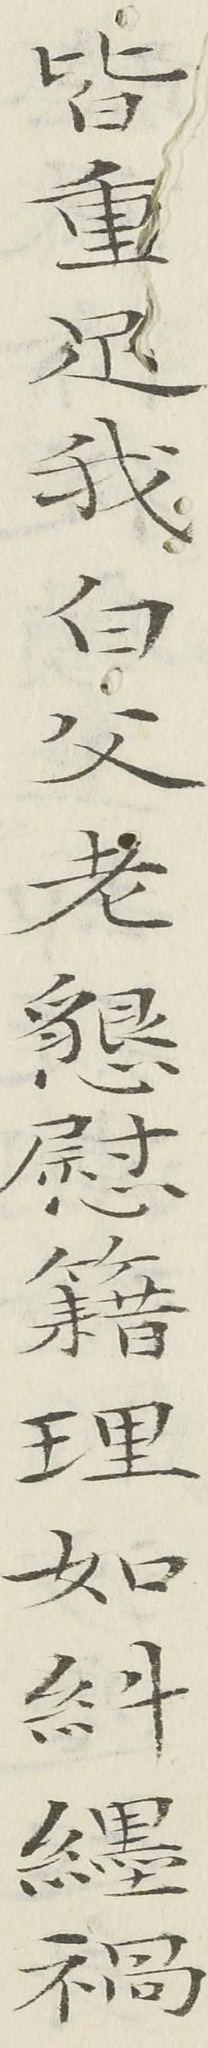皆重足我白父老懇慰籍理如糾纏禍
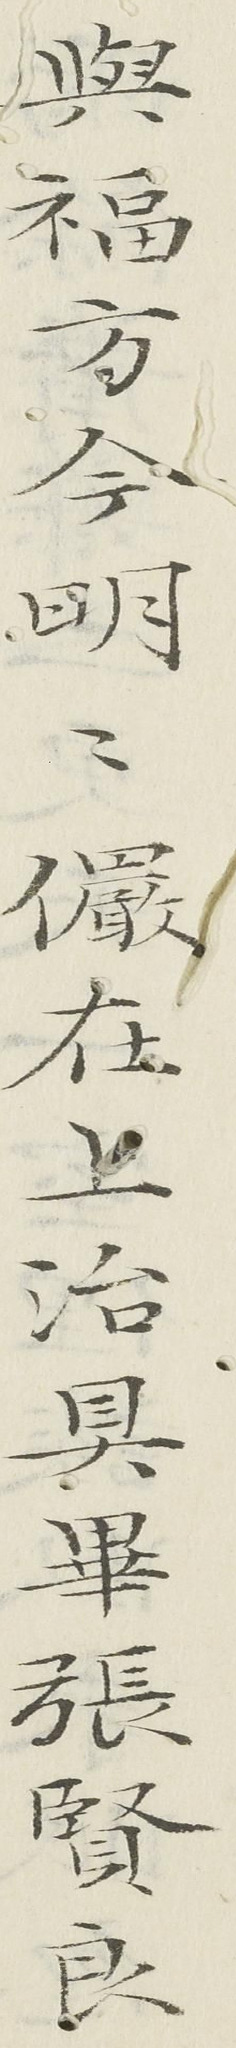與福方今明々玁在上治具畢張賢良
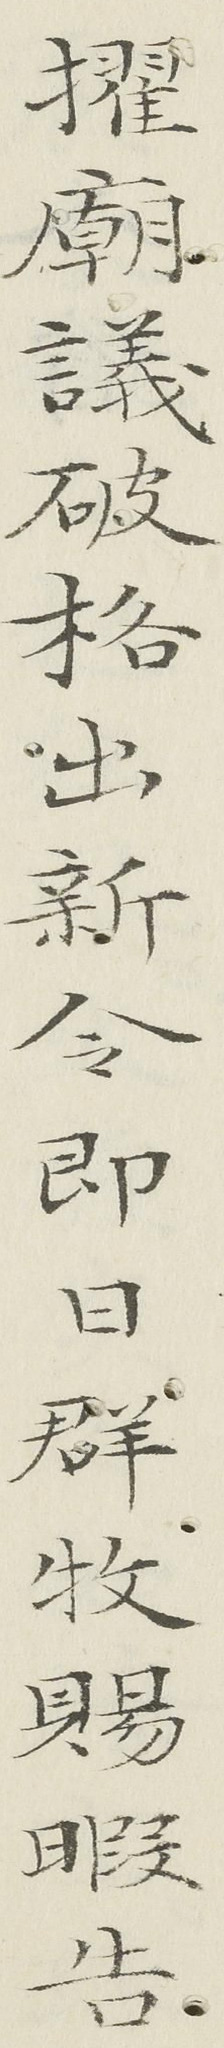稼擢廟議破格出新令即日群牧賜暇告
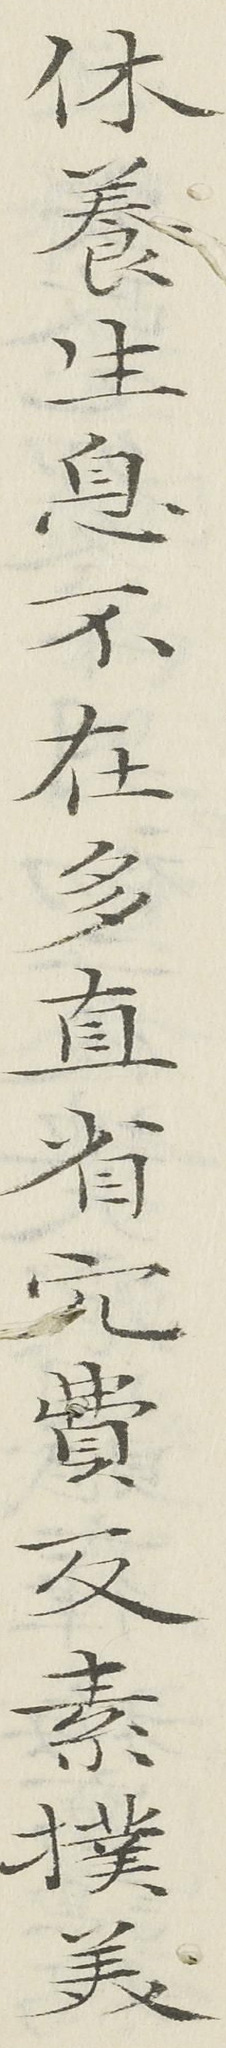休養生息不在多直省穴費反素撲美
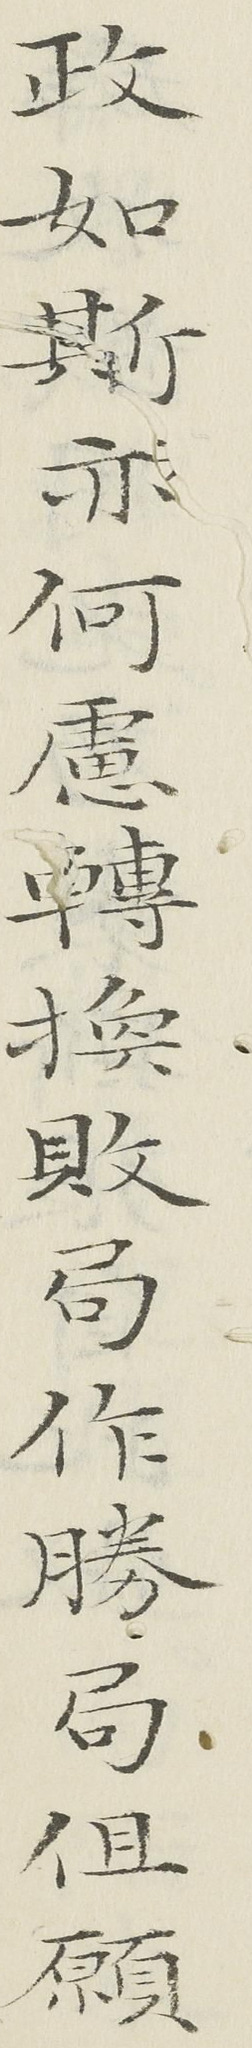政如斯亦何慮転換敗局作勝局伹願

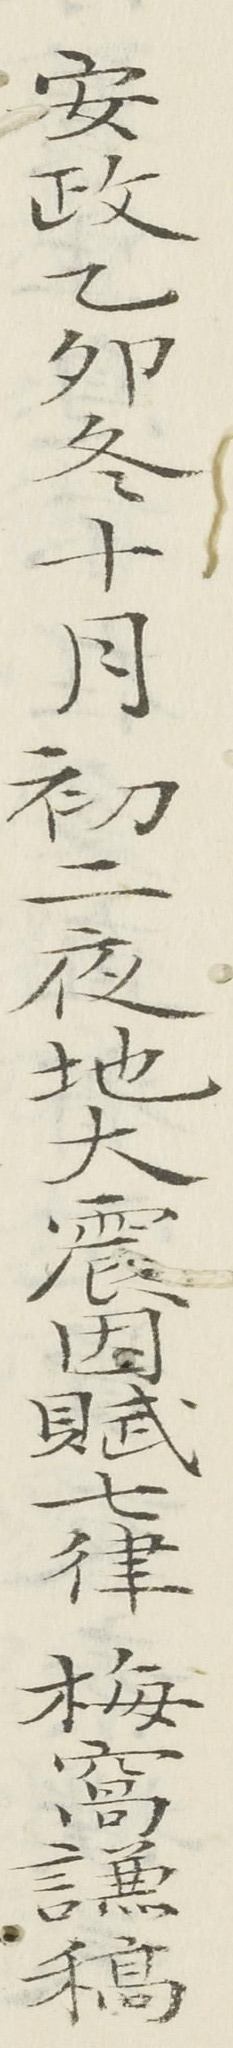安政乙卯冬十月初二夜地大震因賦七律梅窩謙稿
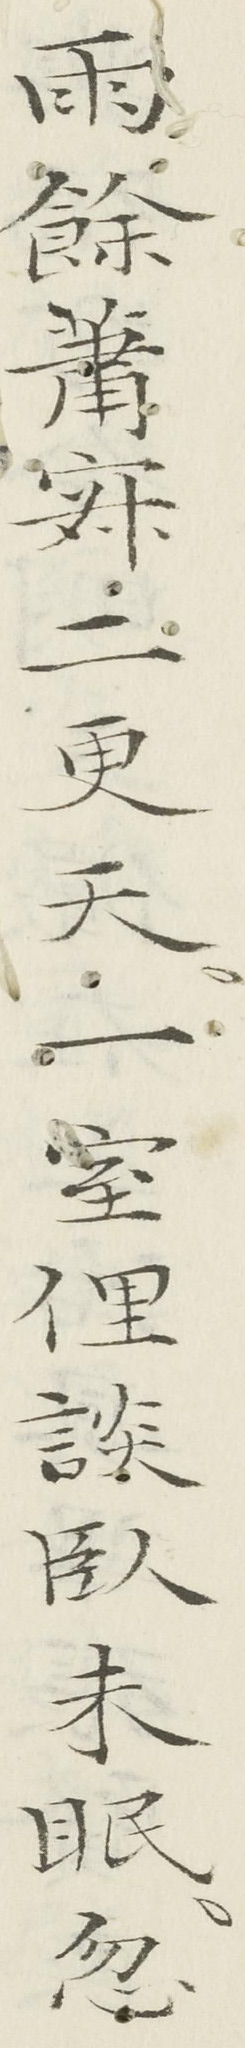雨余粛宑二更天一室俚談臥未眠忽
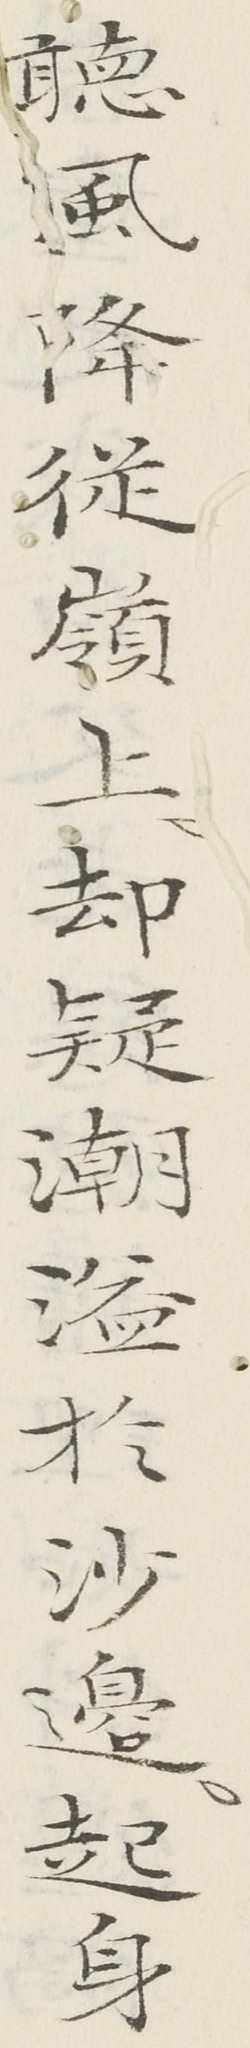聴風降従嶺上却疑潮溢於辺起身
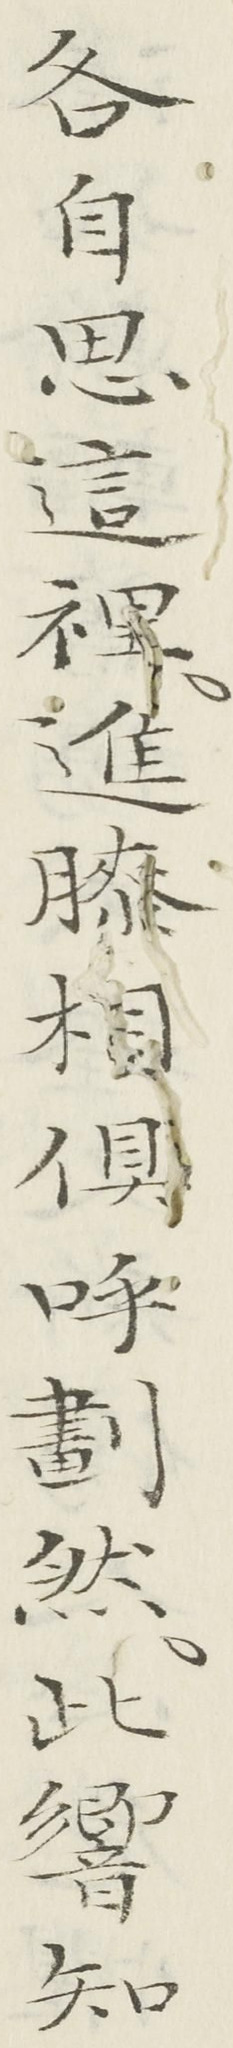各自思這裡進膝相俱呼画然此響知
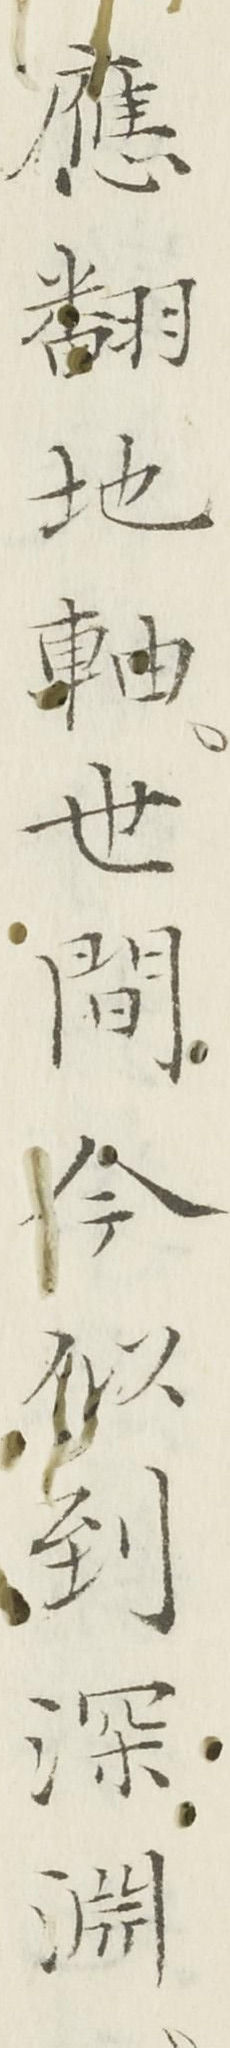応翻地軸世間今以到深淵
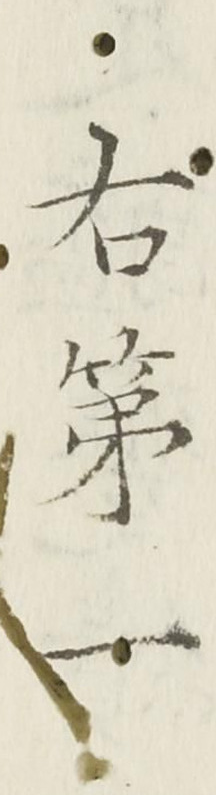右第一
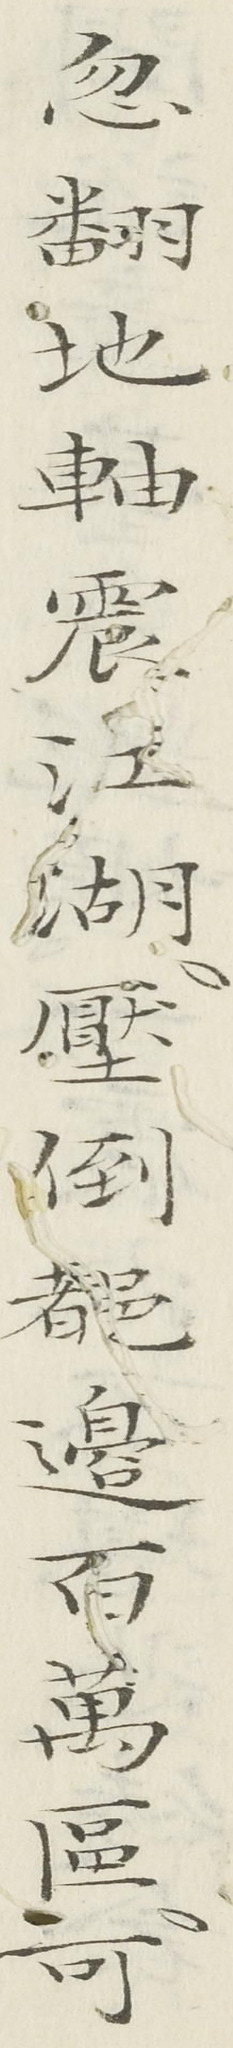忽翻地軸震江湖圧倒辺百万区可
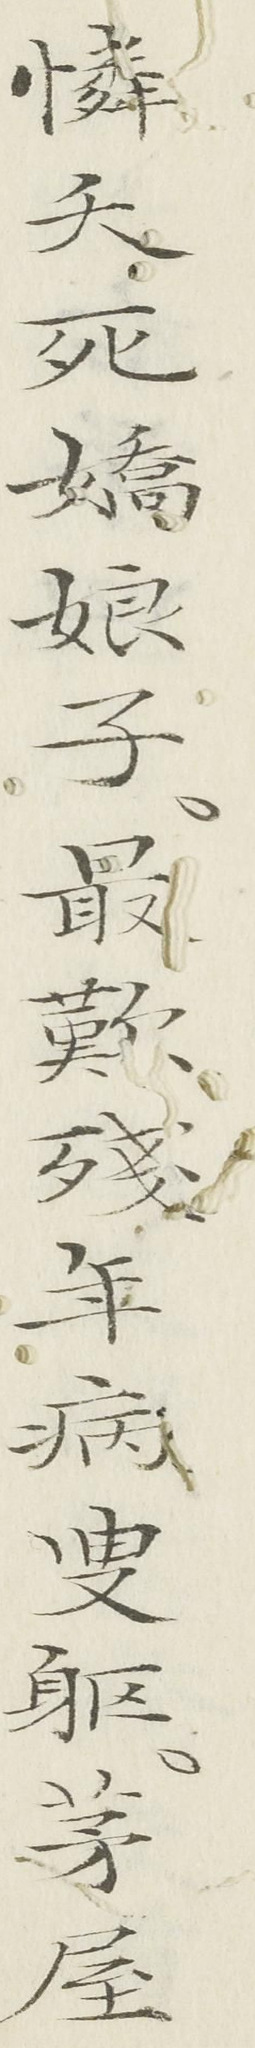憐夭死嬌娘子最歎残年病叟躯茅屋
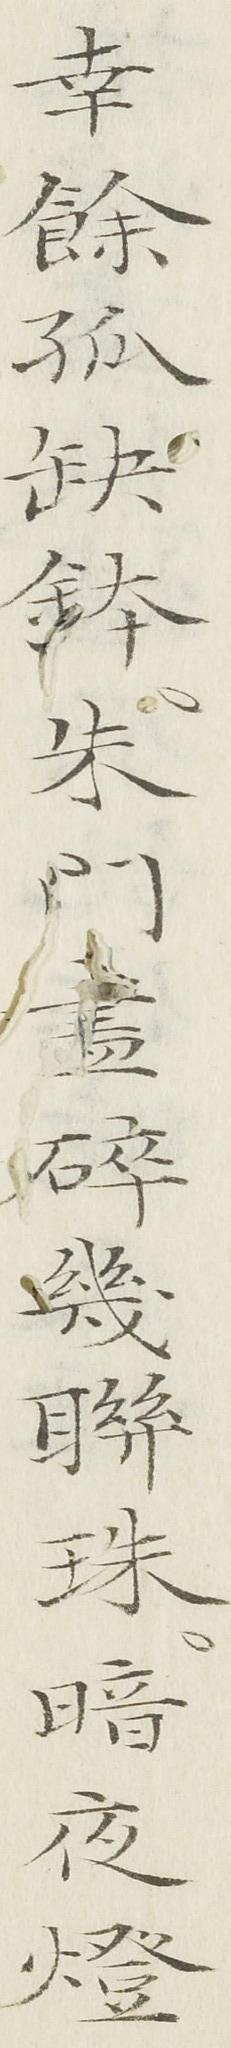幸余孤欠鉢朱門尽砕幾連珠暗夜灯
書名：地震考證　全
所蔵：東京大学地震研究所図書室 Earthquake Research Institute Library, The University of Tokyo, JAPAN
